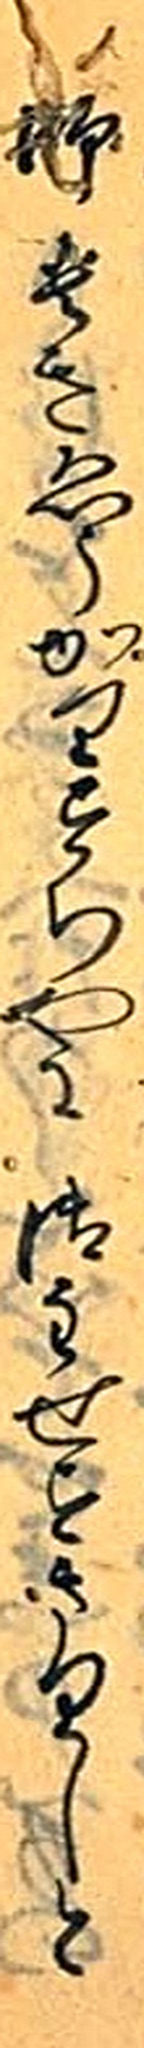師貴きゑうかりすちやに御主せすきりしと
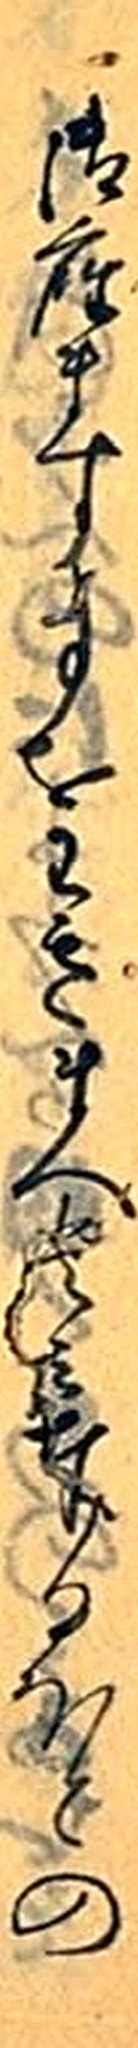御座ます事をわきまへ奉るほとの
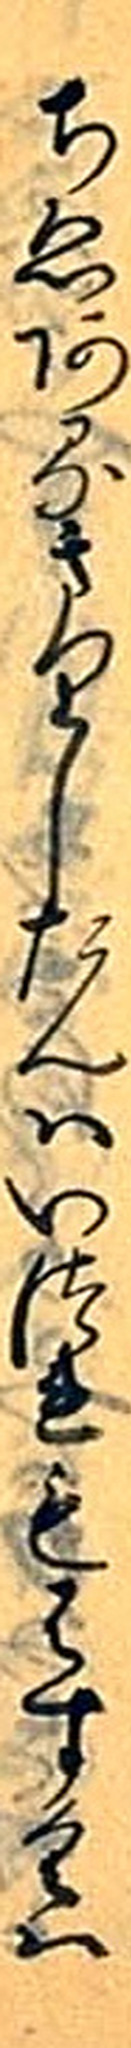ちゑあるきしりたんはいつれもはすくは
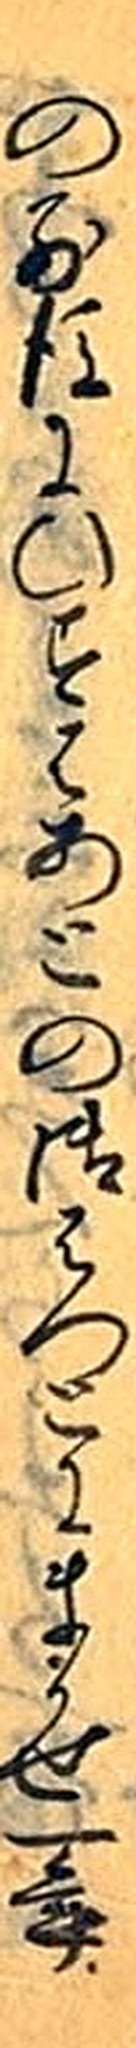の前後にひすはあとの御はつとにまか一年
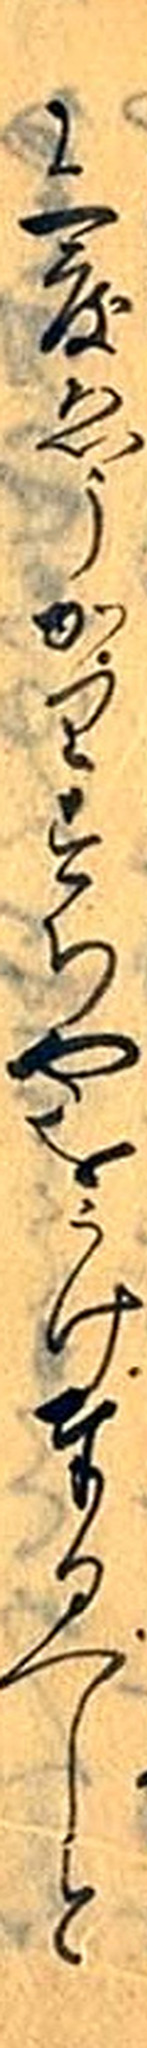に一度ゑうかりすちやをうけ奉るへしと
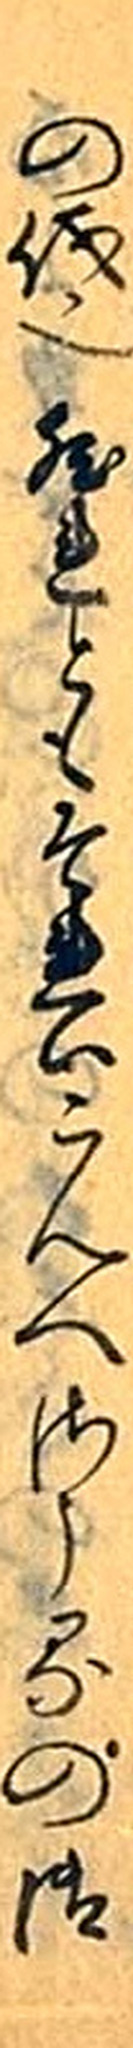の儀也然れともそれはこんへさうるの御
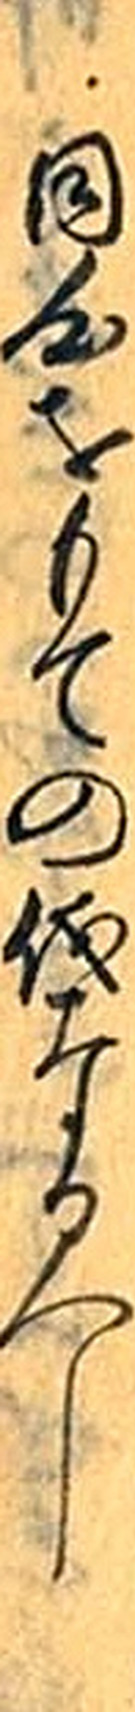同心を持ての儀なるへし
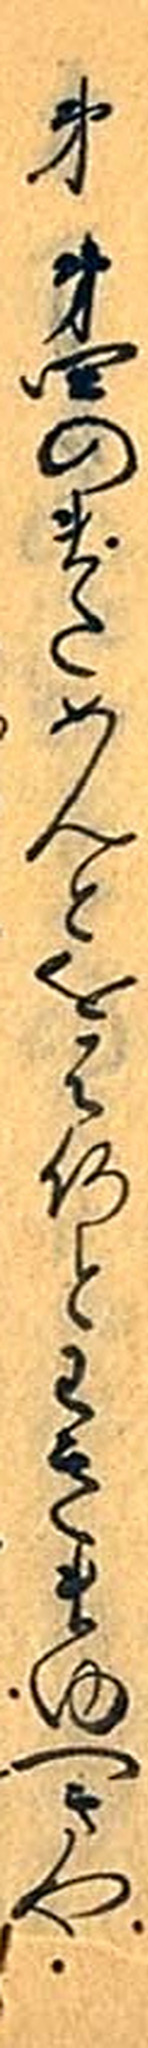弟第四のまためんとをは何とわきまゆへきや
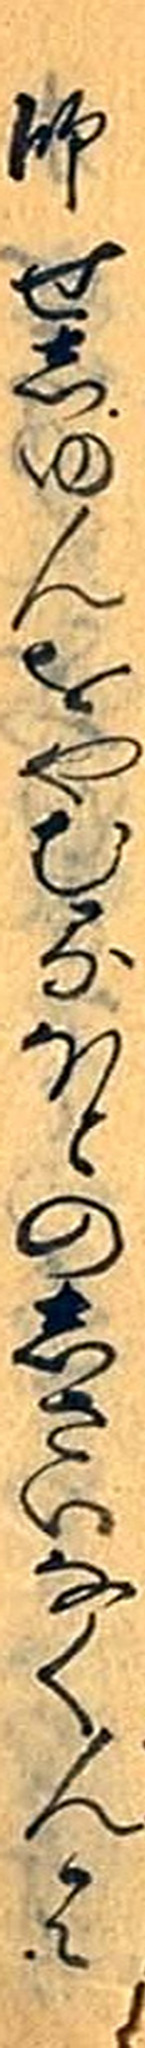師せしゆんをやむるほとのしさいなくんは
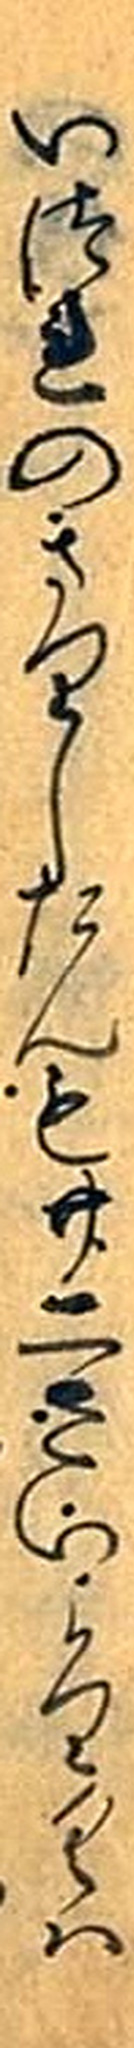いつれのきりしたんも卄二さいよりくは
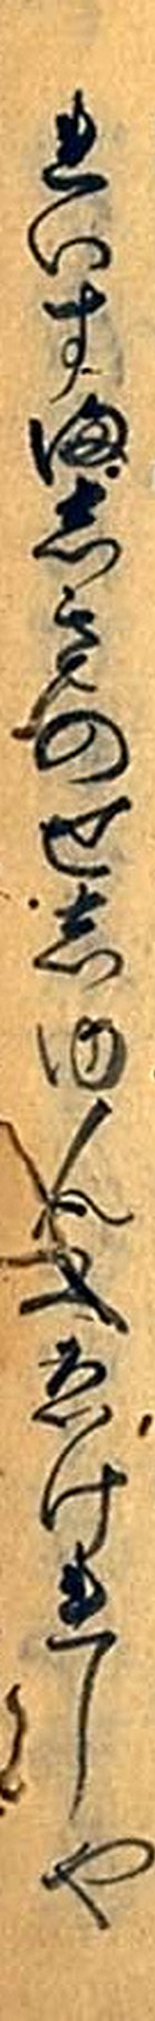れいすましきのせしゆん又ゑけれしや

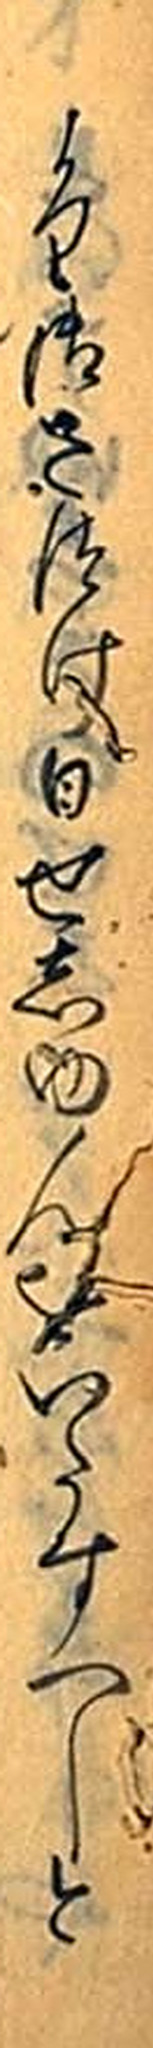より御さつけ日せしゆんをいたすへしと
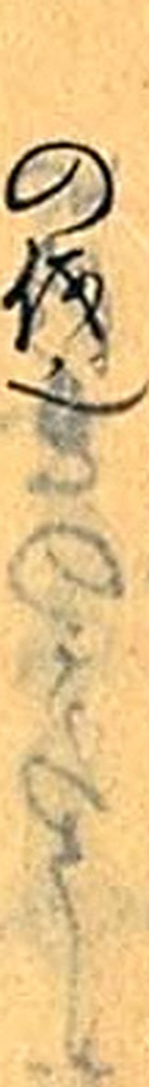の儀也
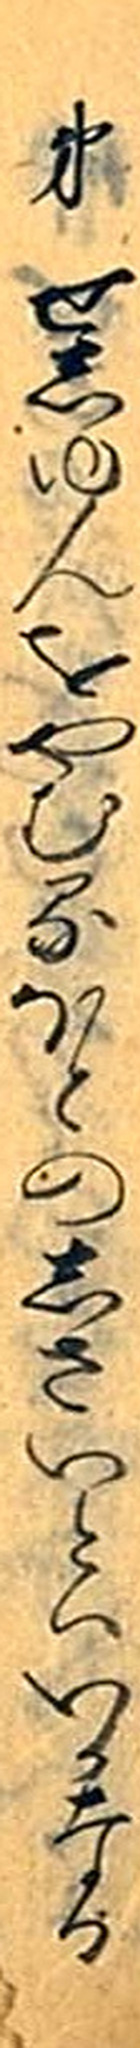弟せしゆんをやむるほとのしさいとはいかなる
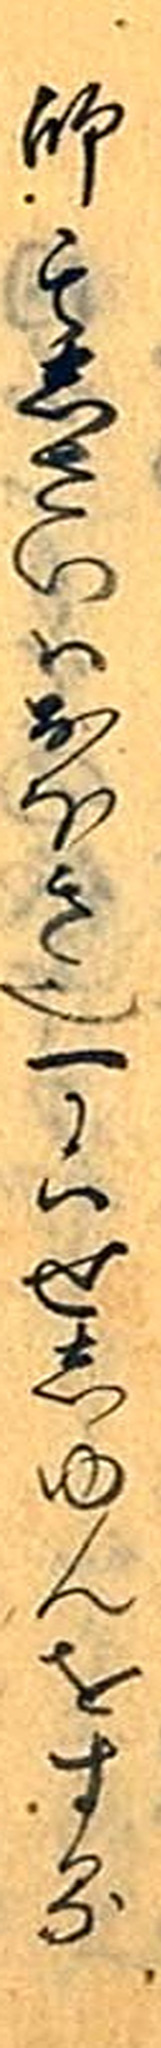師其しさいはおほき也一にはせしゆんをする
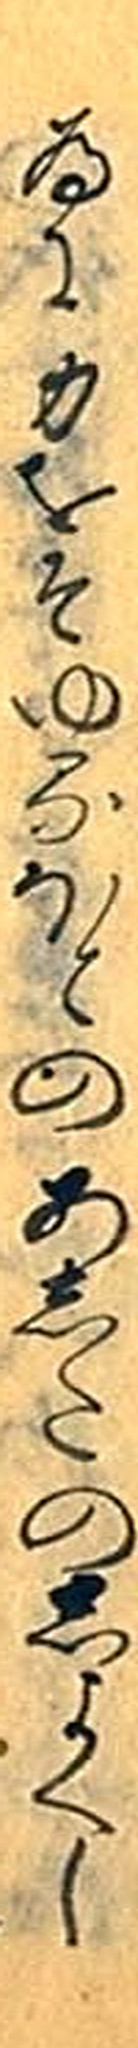為に力をそゆるほとのあしたのしよくし
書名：ドチリナ・キリシタン
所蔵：東京大学総合図書館 / General Library in the University of Tokyo
